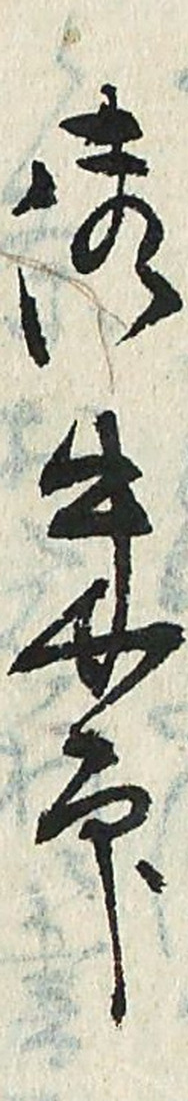御朱印
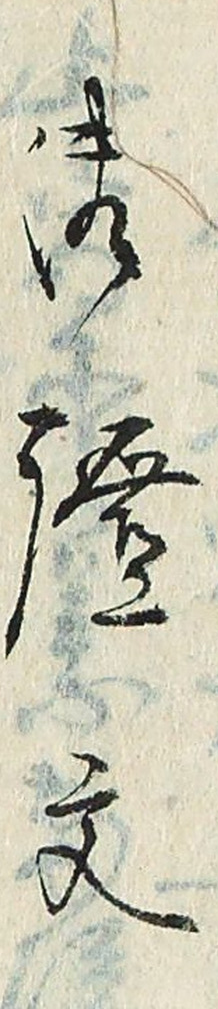御証文
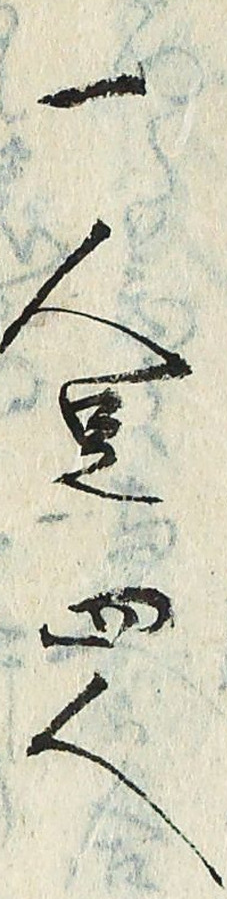一人足四人
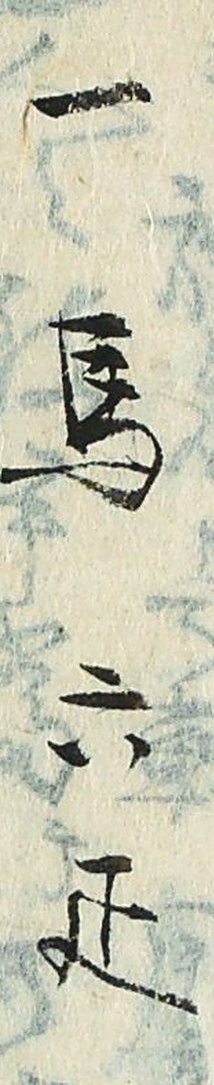一馬六疋
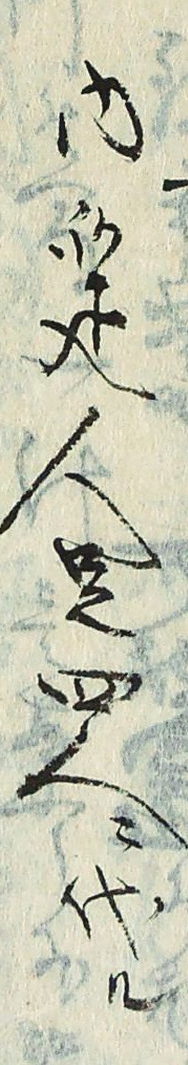内弐疋人足四人に代る
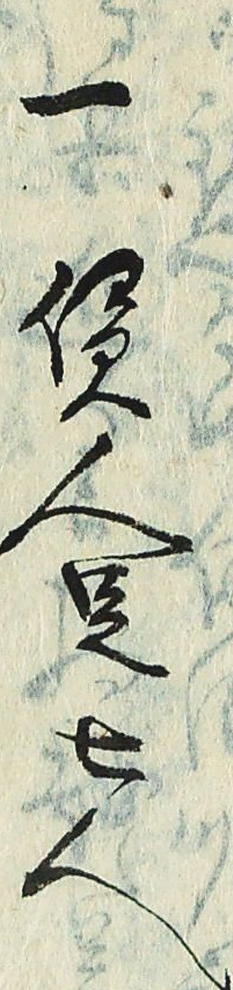一賃人足七人
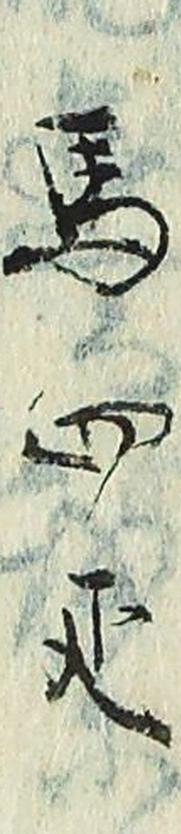馬四疋
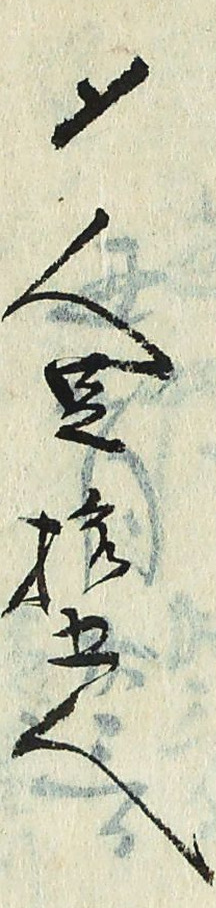〆人足拾五人
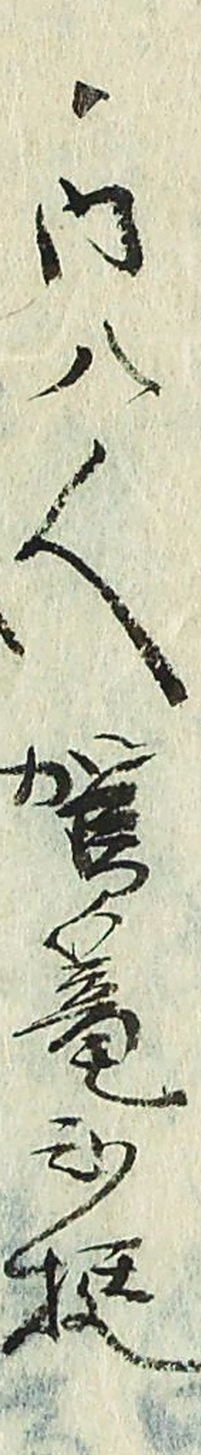内八人駕籠弐挺
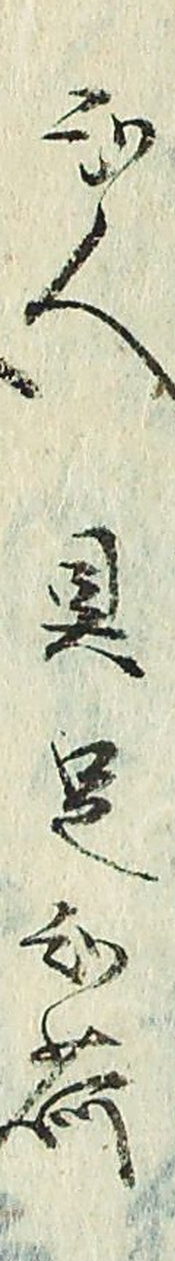弐人具足弐荷
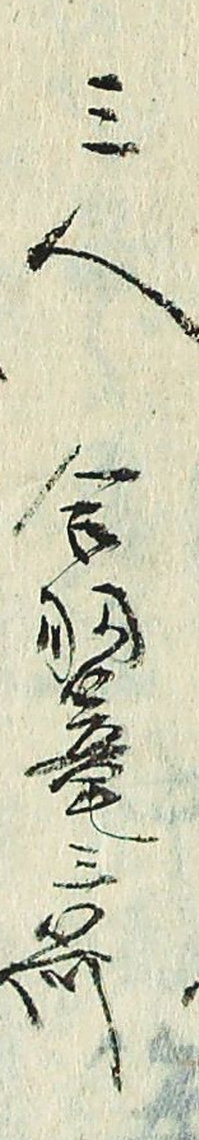三人合羽篭三荷
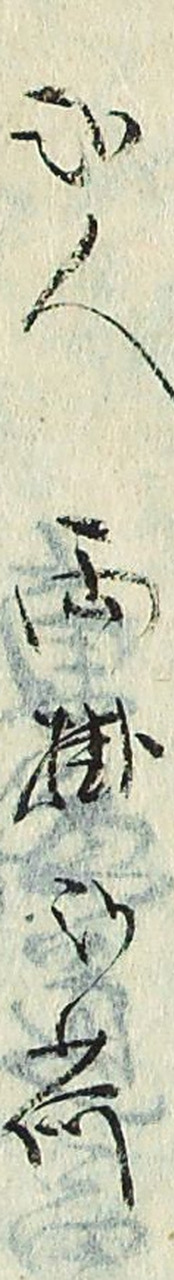弐人両掛弐荷
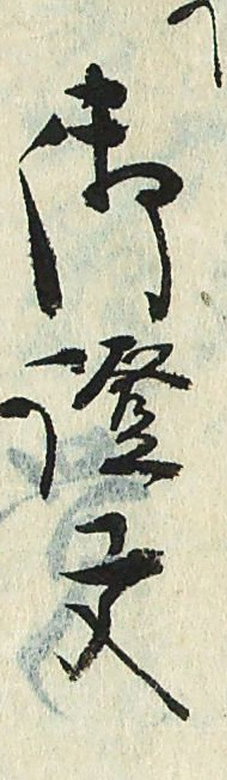御証文
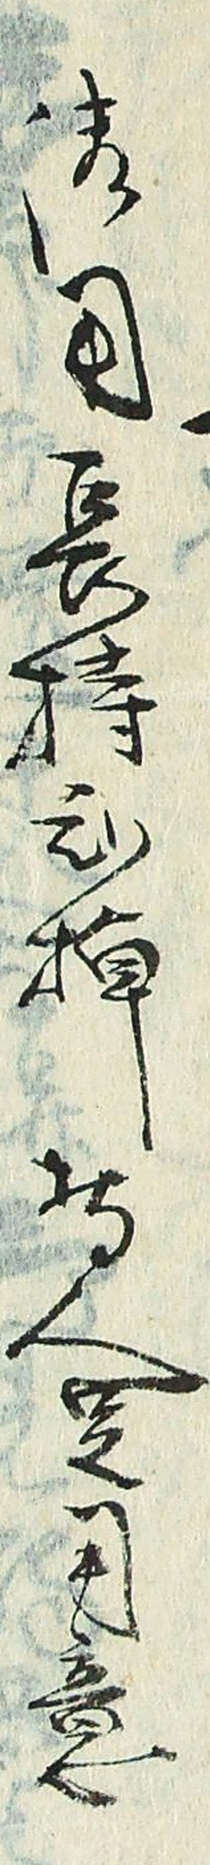御用長持弐棹持人足用意
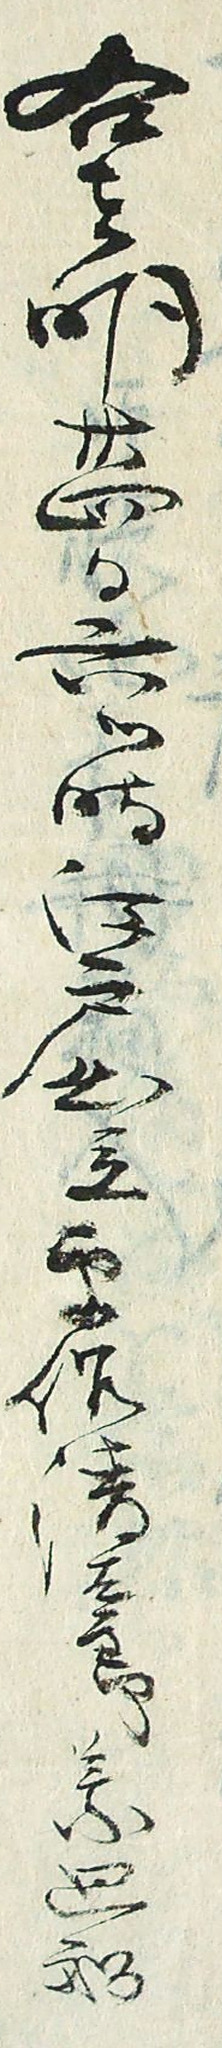右は明廿四日六つ時江戸出立平作清太郎義廻船

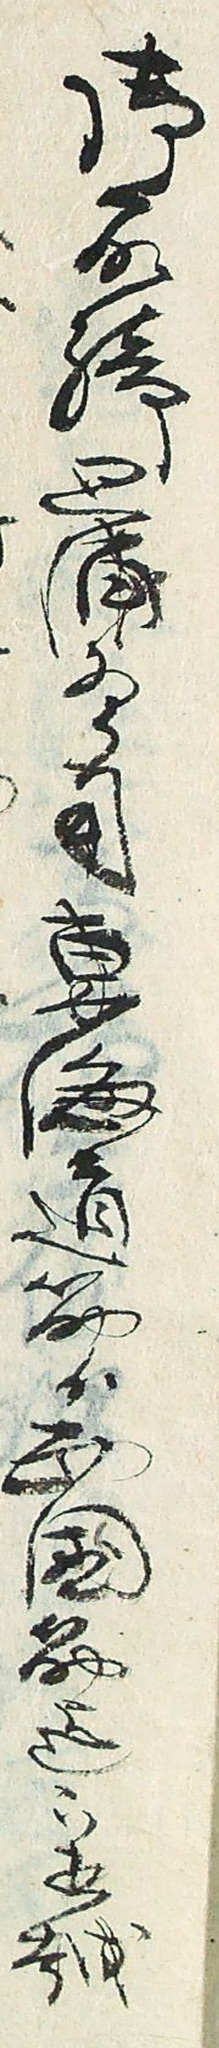御取締廻浦為御用東海道筋ゟ西国筋迄被相越
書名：公辺御役人為御廻浦御立越諸御用一巻
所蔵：鳴門教育大学 Naruto University of Education
